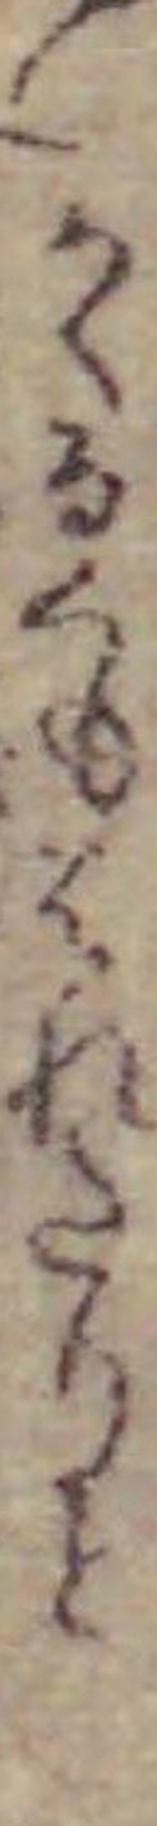かくるくもはれたりと
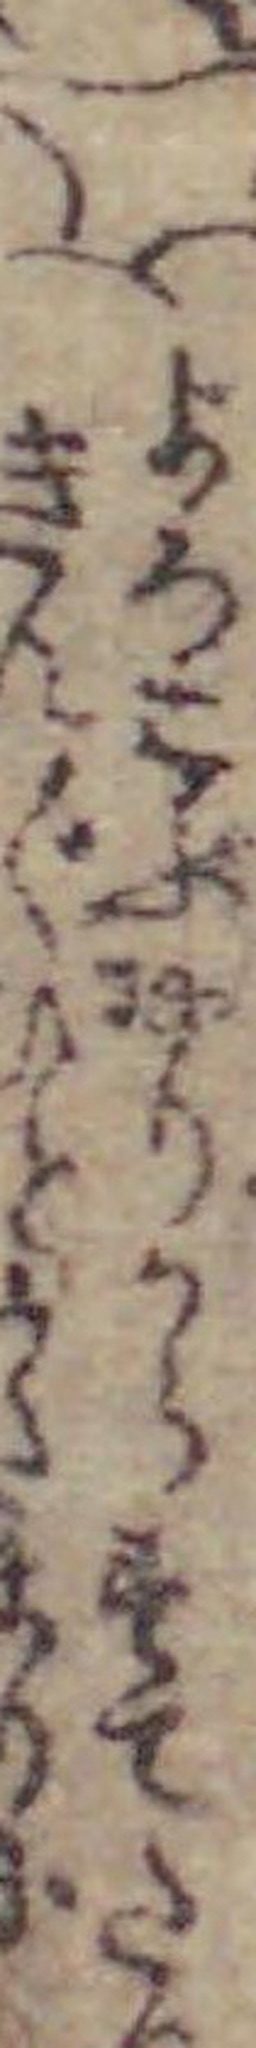きん〴〵ひとかたまりに
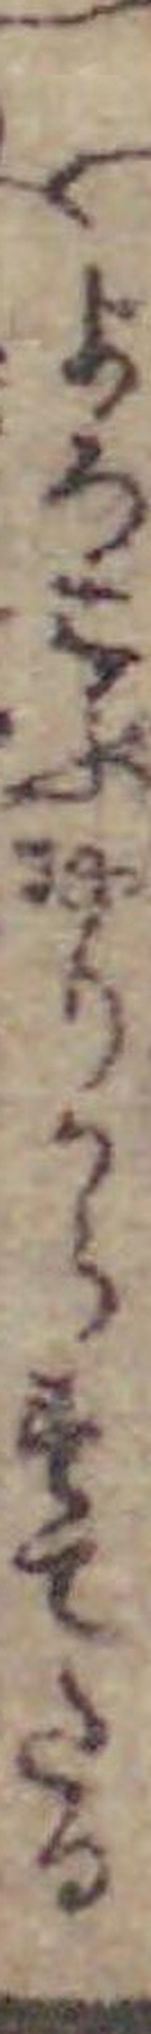よろこぶおりからすてたる
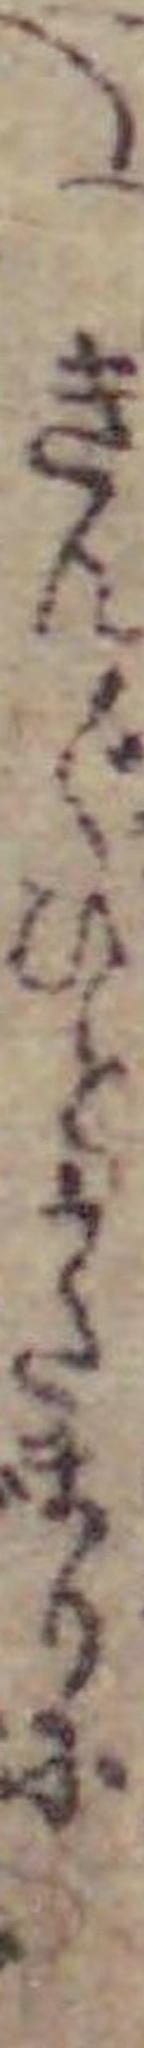きん〴〵ひとかたまりに
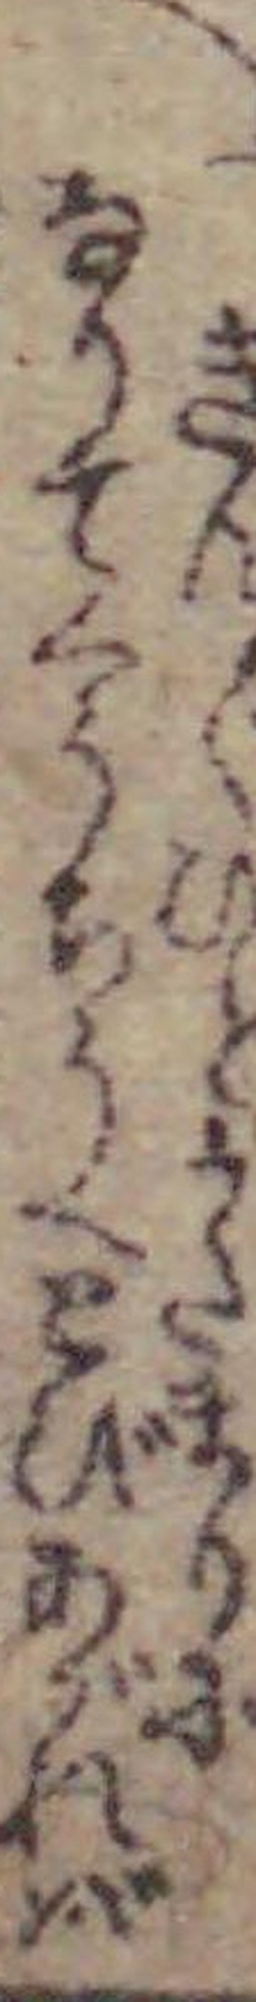なりてくうちうへとびあがれば
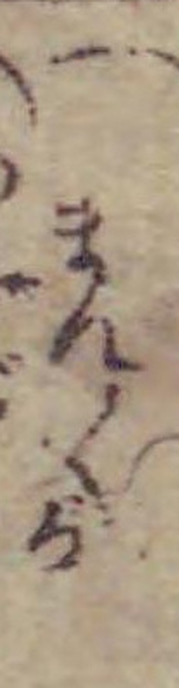まん〳〵が
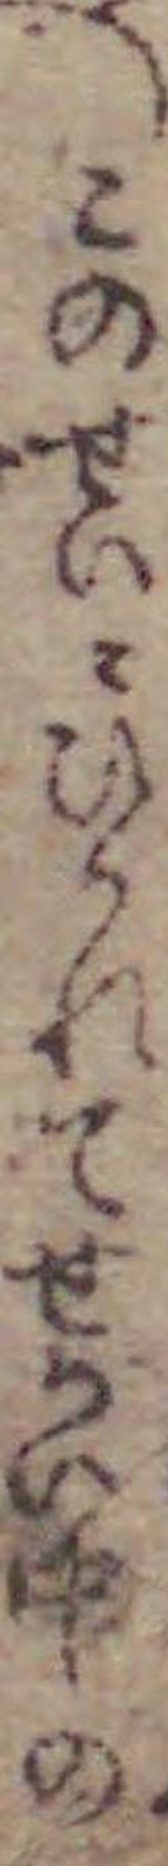このせいにひかれてせかい中の
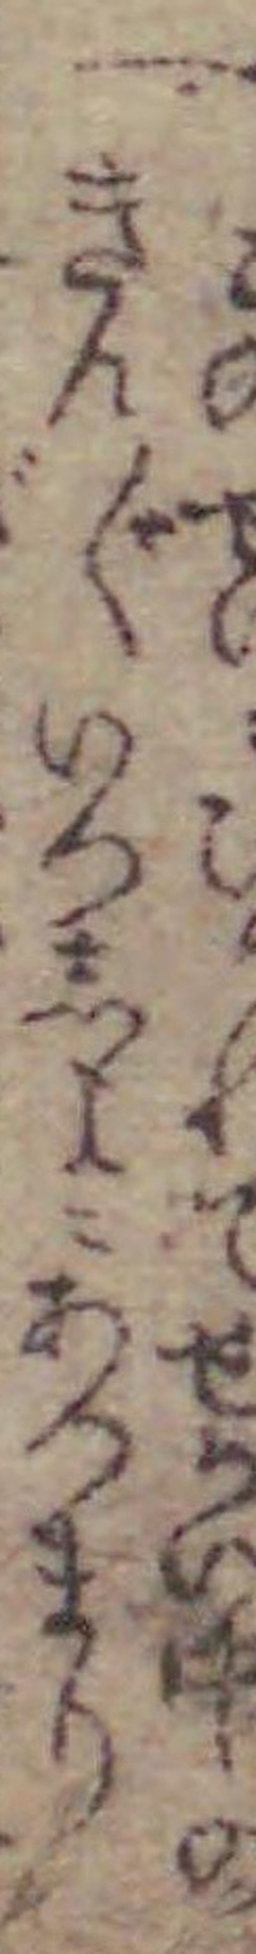きん〴〵いつしよにあつまり
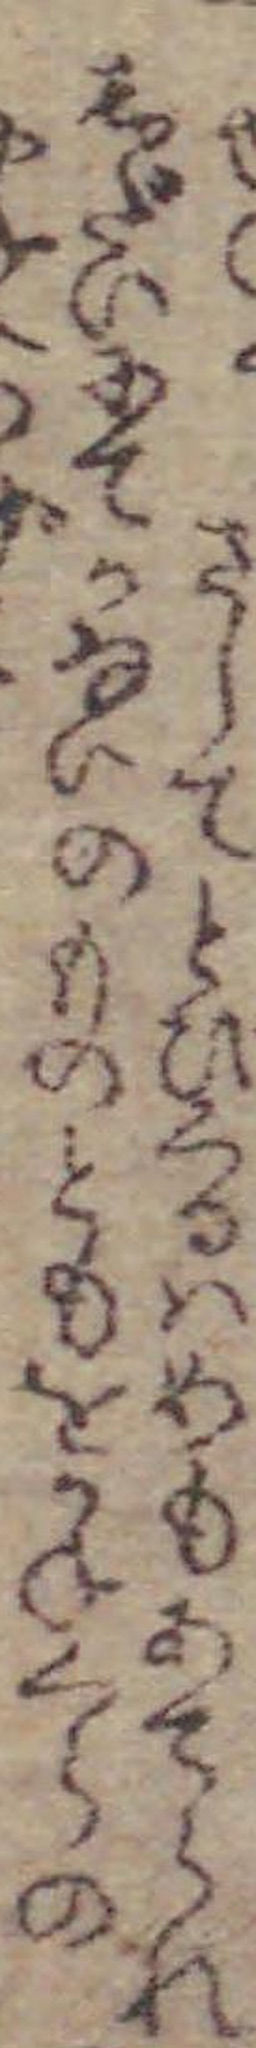しだいにてかないのものともをかねくらの
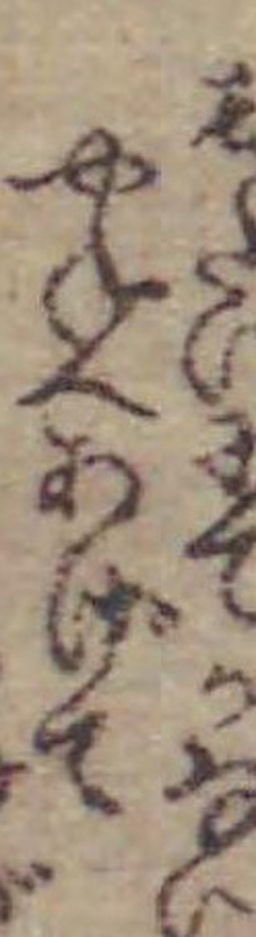はねへあげて
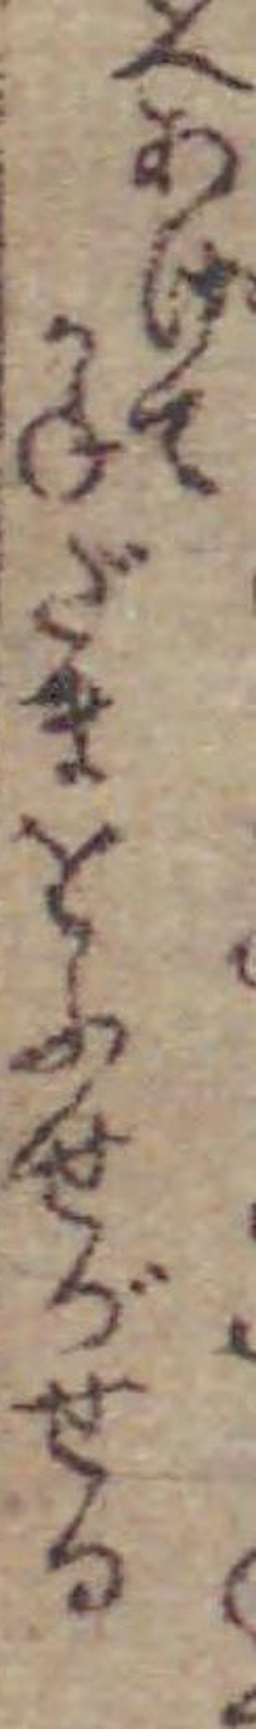かねだまをふせがせる

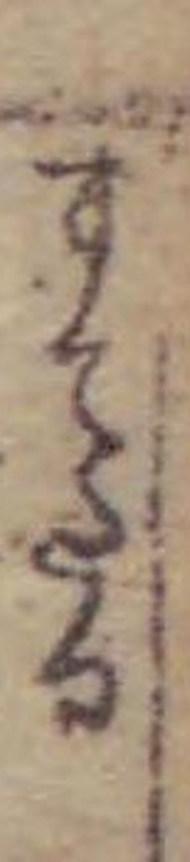すてたる
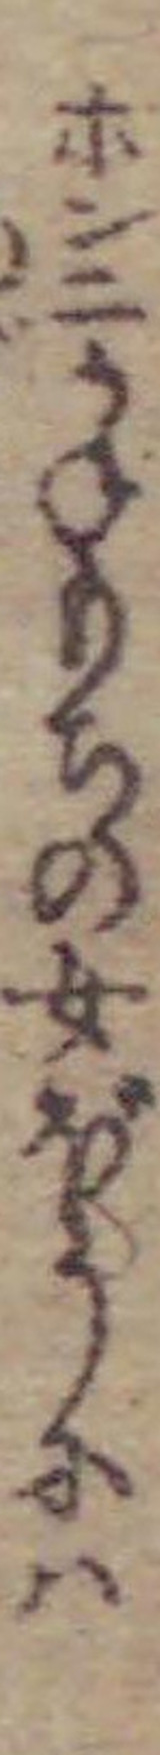ホンニかねもちの女ぼうには
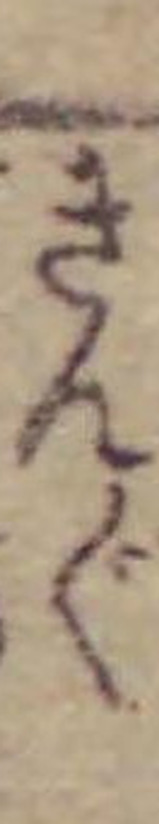きん〴〵
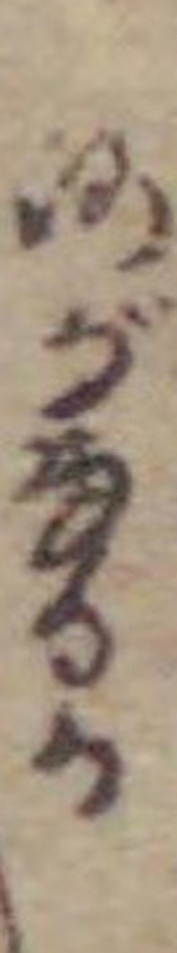何がなるか
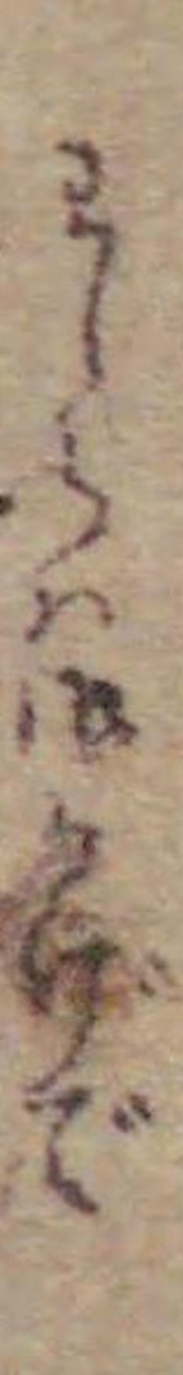わしらは御かげで
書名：莫切自根金生木 : 3巻
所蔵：国立国会図書館 National Diet Library, JAPAN
